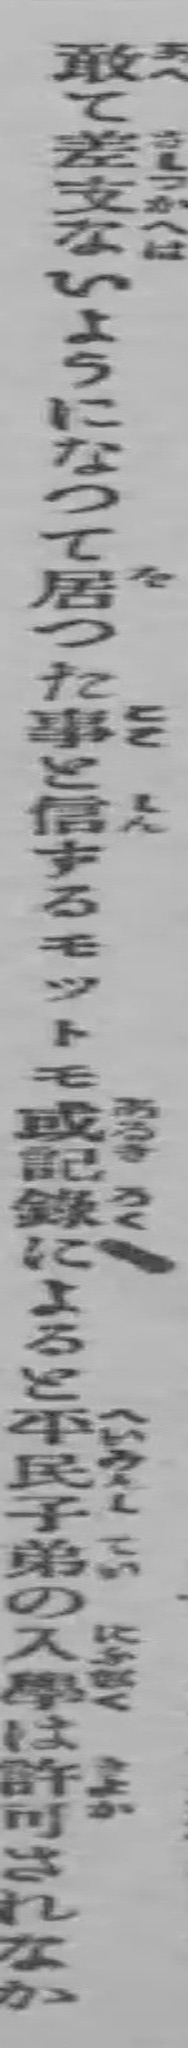敢て差支ないようになつて居つた事と信ずるモツトモ或記録によると平民子弟の入学は許可されなか
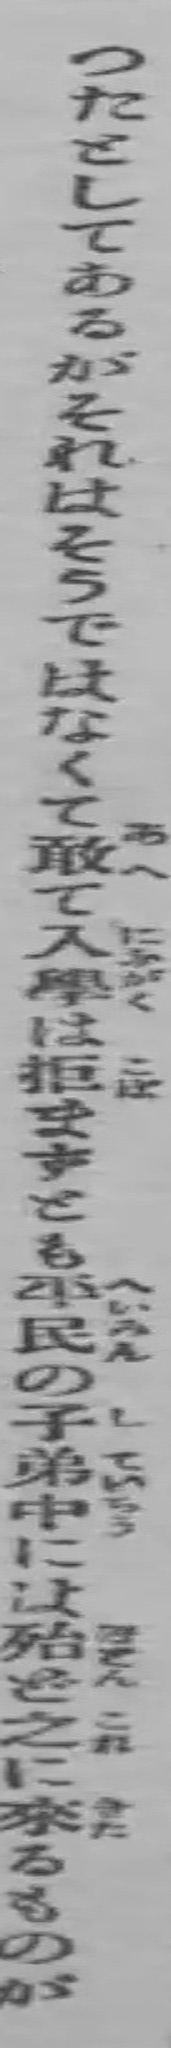つたとしてあるがそれはそうではなくて敢て入学は拒まずとも平民の子弟中には殆ど之に来るものが
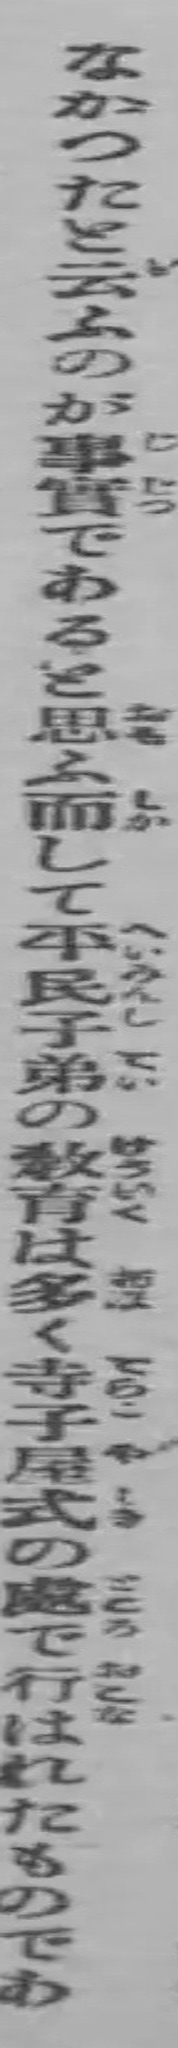なかつたと云ふのが事実であると思ふ而して平民子弟の教育は多く寺子屋式の処で行はれたものであ
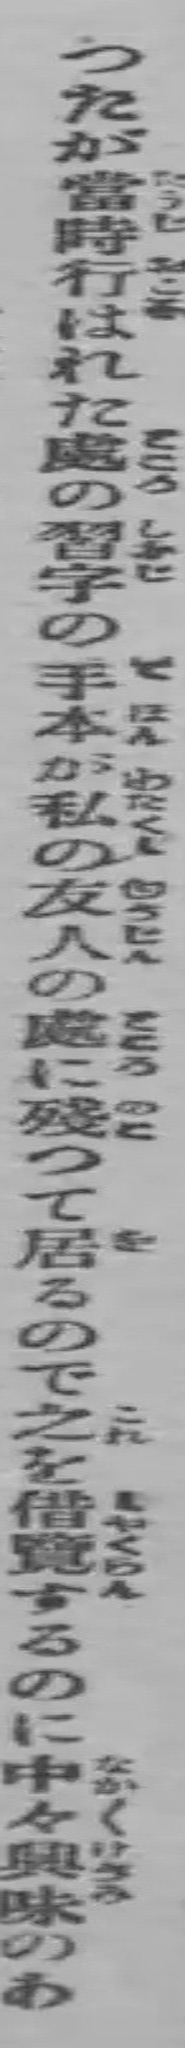つたが当時行はれた処の習字の手本が私の友人の処に残つて居るので之を借覧するのに中々興味のあ
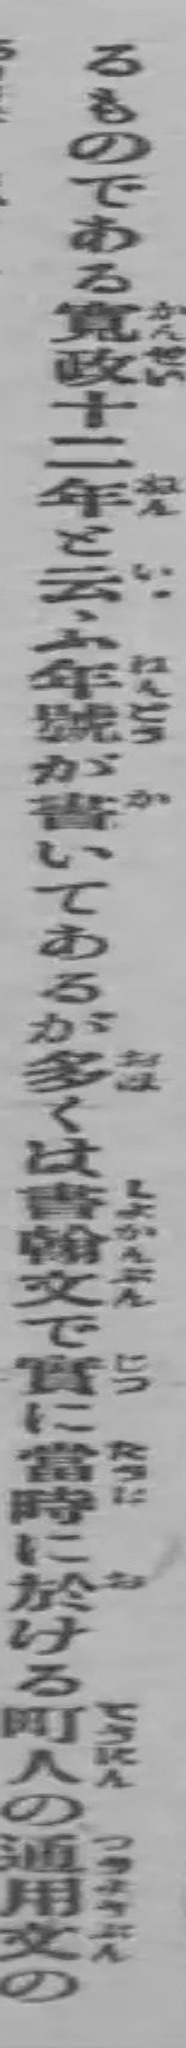るものである寛政十二年と云ふ年号が書いてあるが多くは書翰文で実に当時に於ける町人の通用文の
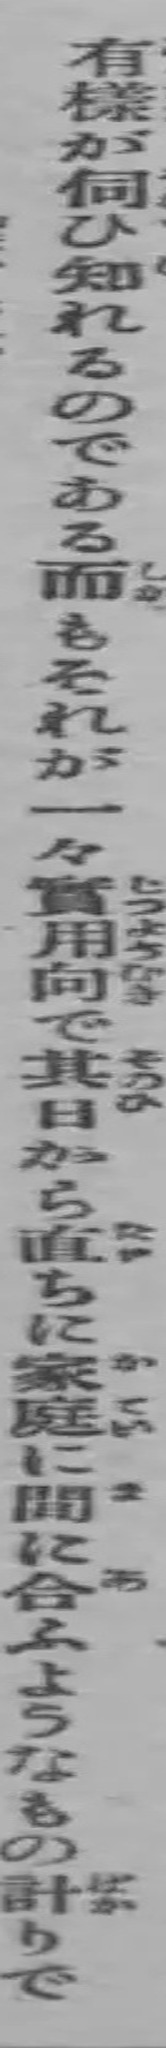有様が伺ひ知れるのである而もそれが一々実用向で其日から直ちに家庭に間に合ふようなもの計りで
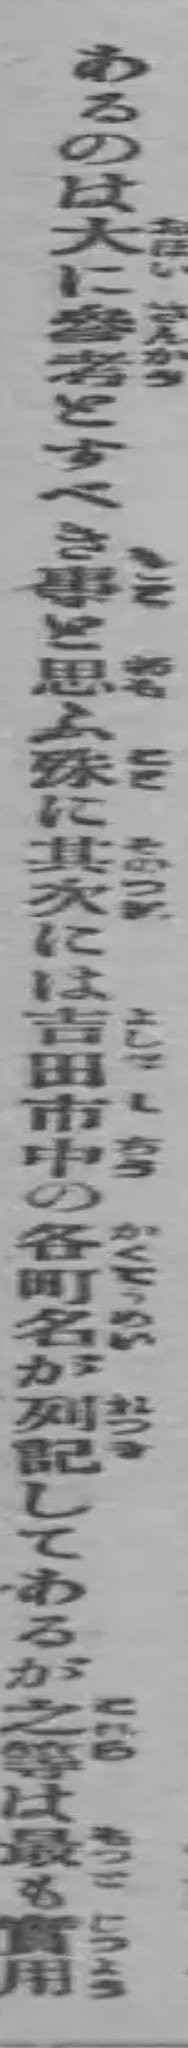あるのは大に参考とすべき事と思ふ殊に其次には吉田市中の各町名が列記してあるが之等は最も実用

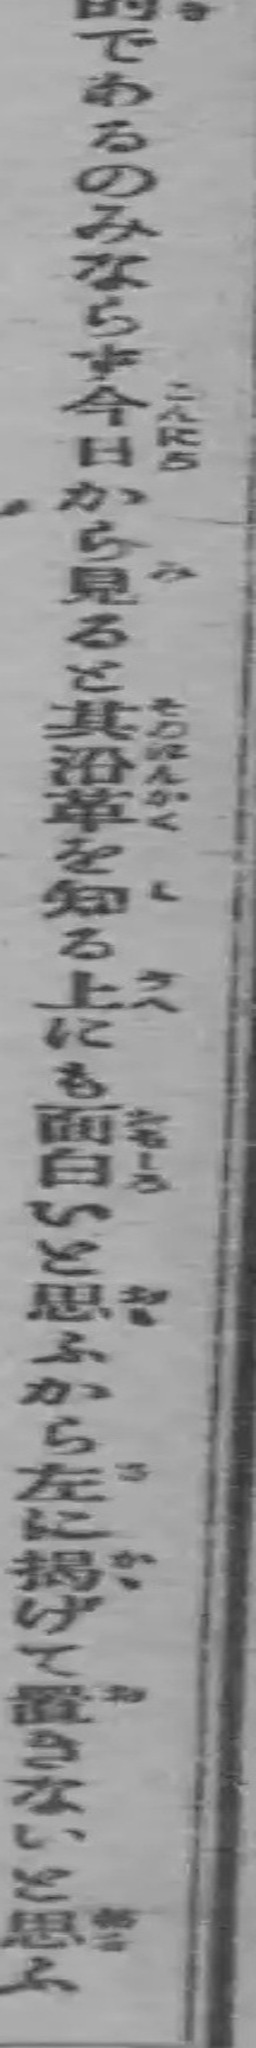的であるのみならず今日から見ると其沿革を知る上にも面白いと思ふから左に掲げて置きたいと思ふ
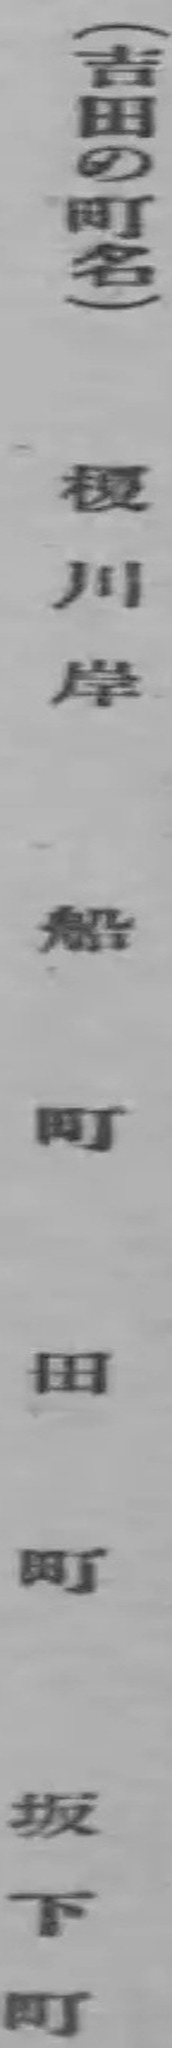(吉田の町名)榎川岸船町田町坂下町
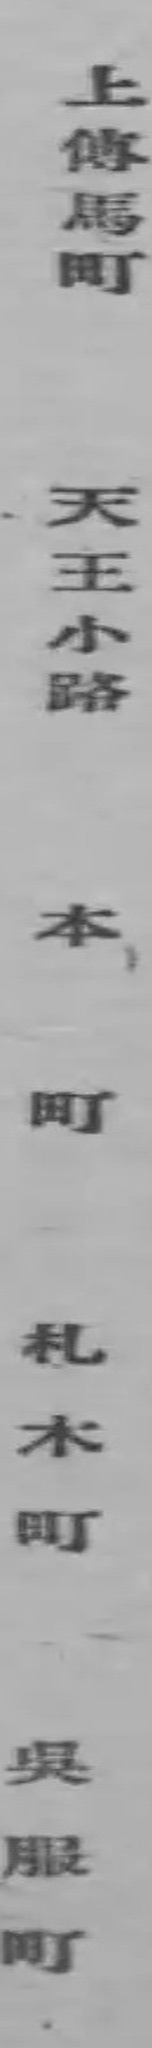上伝馬町天王小路本町札木町呉服町
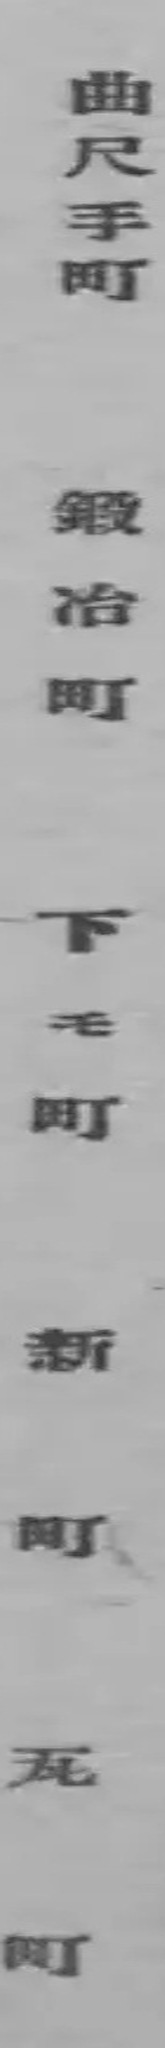曲尺手町鍛冶町下モ町新町瓦町
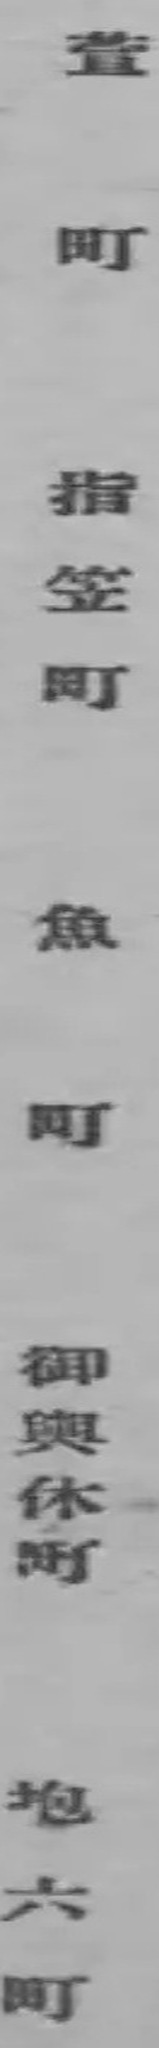萱町指笠町魚町御輿休町垉六町
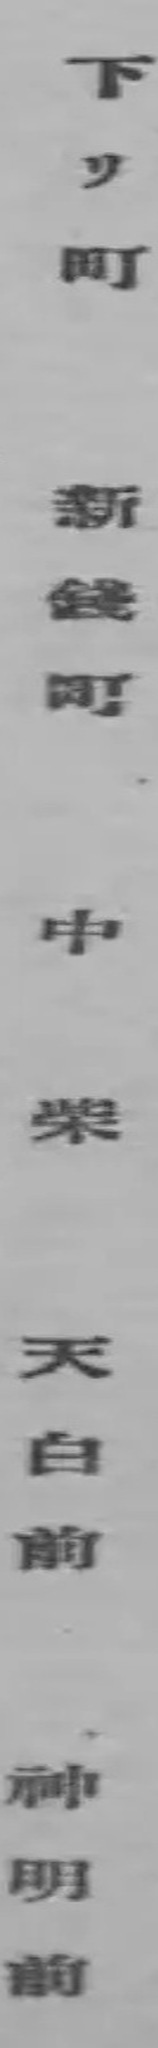下リ町新銭町中柴天白前神明前
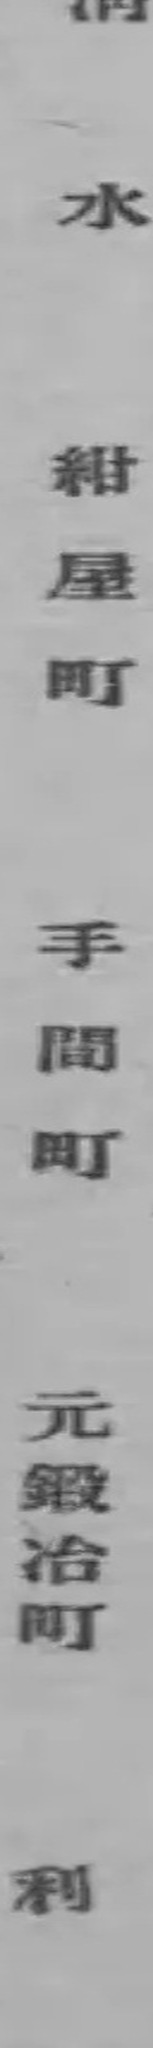清水紺屋町手間町元鍛冶町利町
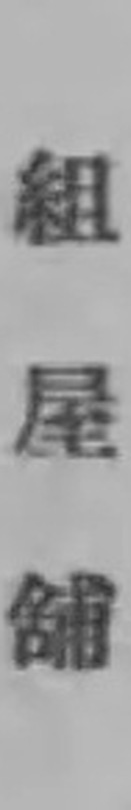組屋舗
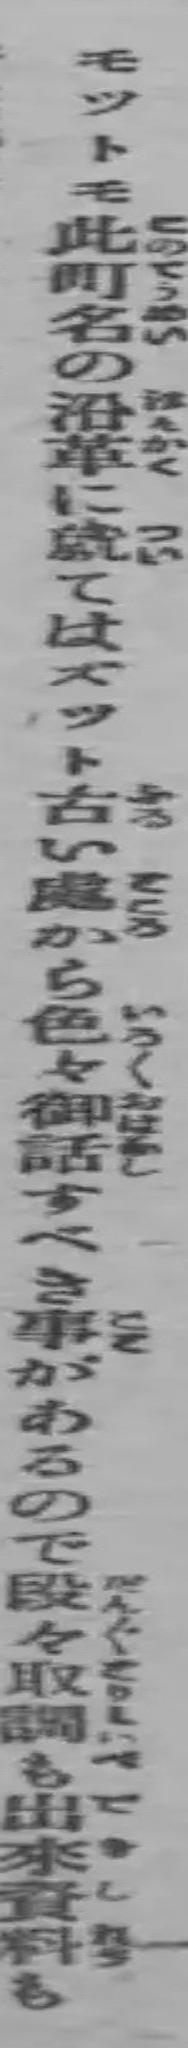モツトモ此町名の沿革に就てはズツト古い処から色々御話すべき事があるので段々取調も出来資料も
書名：豊橋市史談
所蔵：国立国会図書館 National Diet Library, JAPAN
